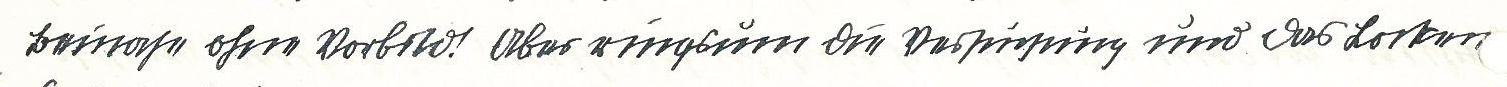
Beinahe ohne Vorbild! Aber ringsum die Versuchung und das Locken
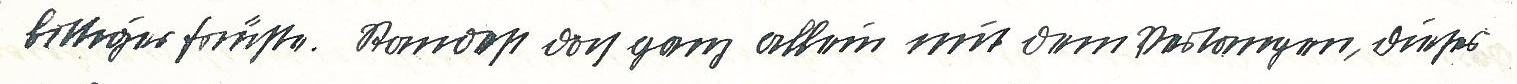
billiger Früchte. Standest doch ganz allein mit dem Verlangen, dieses
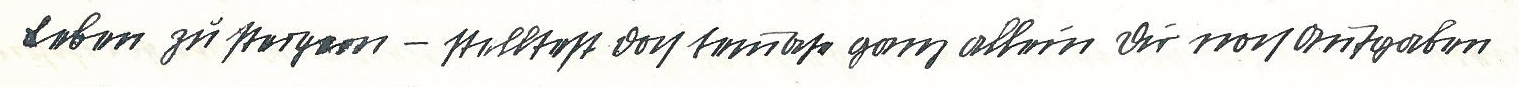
Leben zu steigern – stelltest doch beinahe ganz allein Dir noch Aufgaben
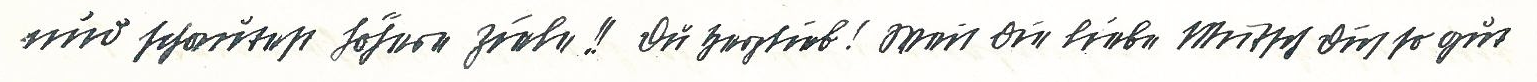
und schautest höhere Ziele!! Du Herzlieb! Weil die liebe Mutsch Dich so gut
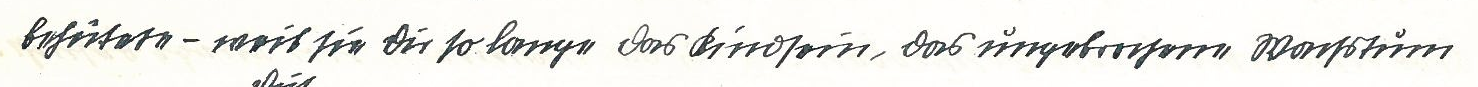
behütete – weil sie Dir so lange das Kindsein, das ungebrochene Wachstum
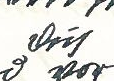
Dich
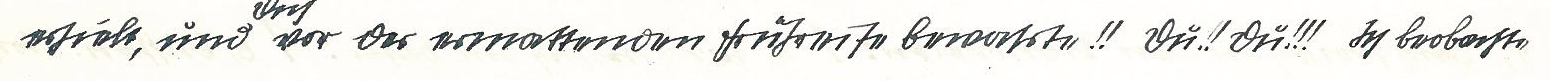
erhielt und vor der ermattenden Frühreife bewahrte!! Du!! Du!!! Ich beobachte
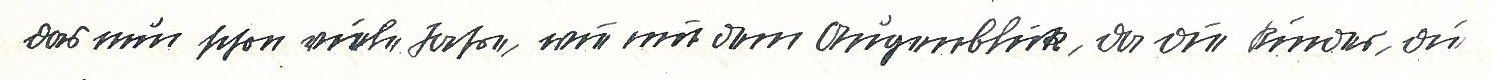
das nun schon so viele Jahre, wie mit dem Augenblick, da die Kinder, die
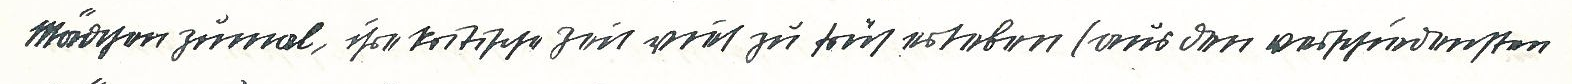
Mädchen zumal, ihre kritische Zeit viel zu früh erleben (aus den verschiedensten
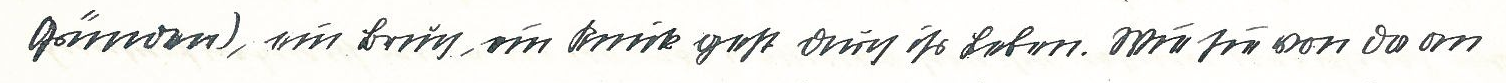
Gründen), ein Bruch, ein Knick geht durch ihr Leben. Wie sie von da an
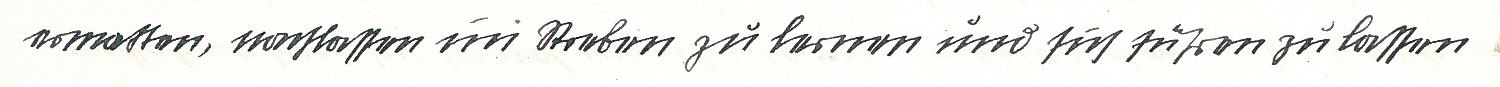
ermatten, nachlassen im Streben zu lernen und sich führen zu lassen
